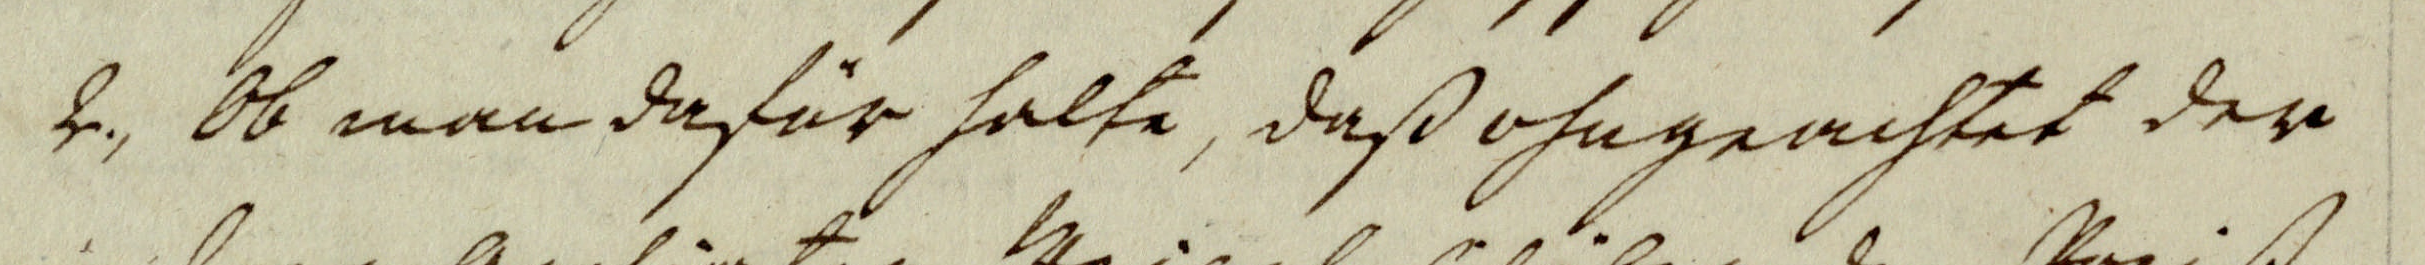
2., Ob man dafür halte, daß ohngeachtet der
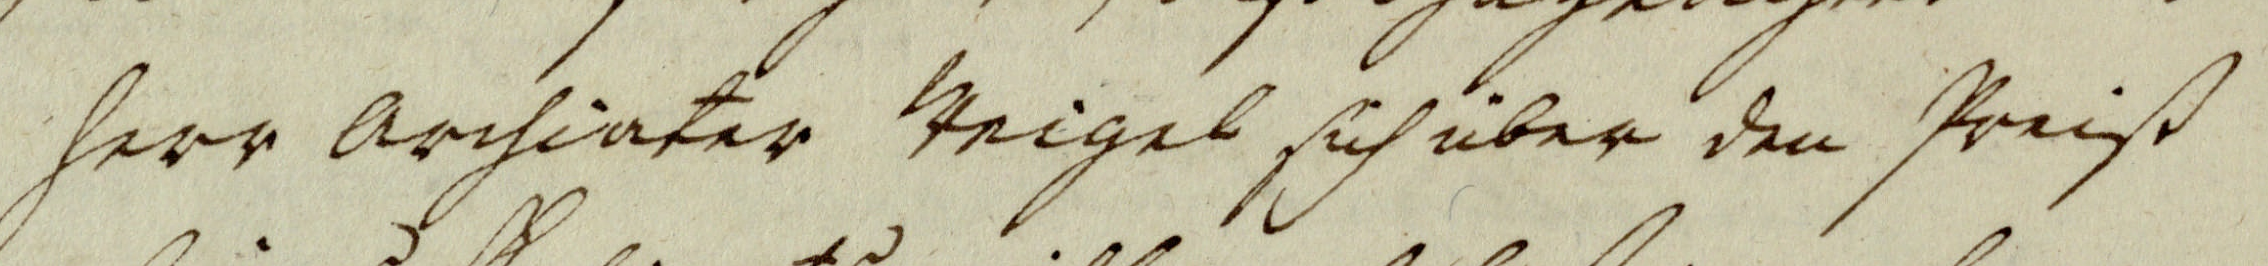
Herr Archiater Weigel sich über den Preiß
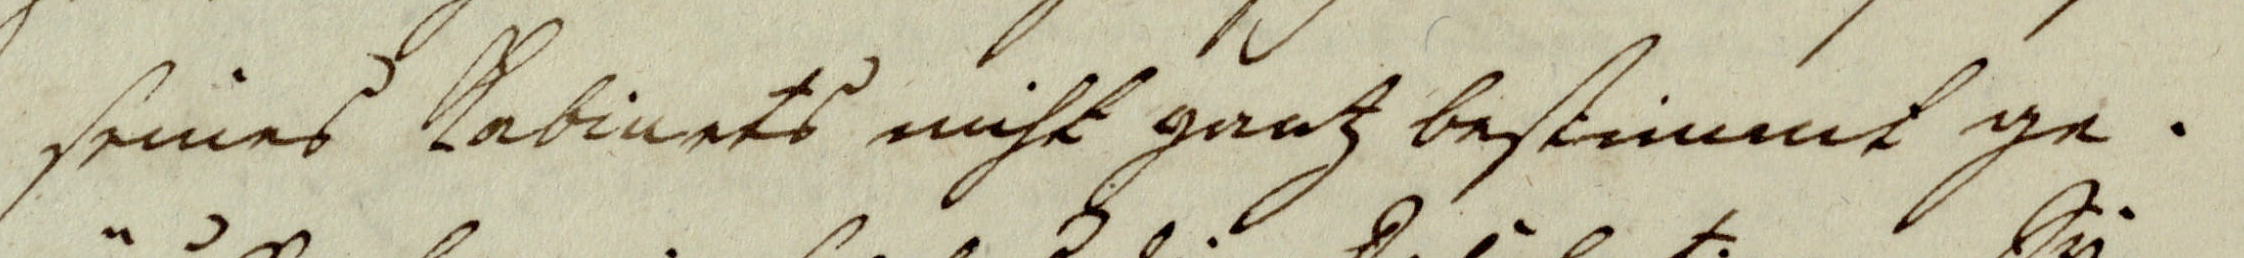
seines Kabinets nicht gantz bestimmt ge¬
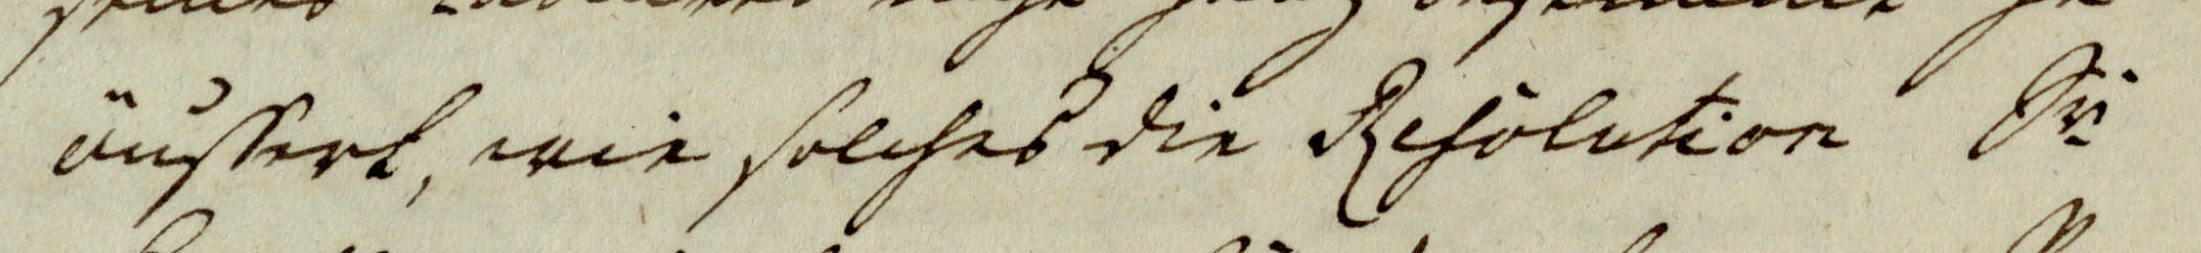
äussert, wie solches die Resolution Sr
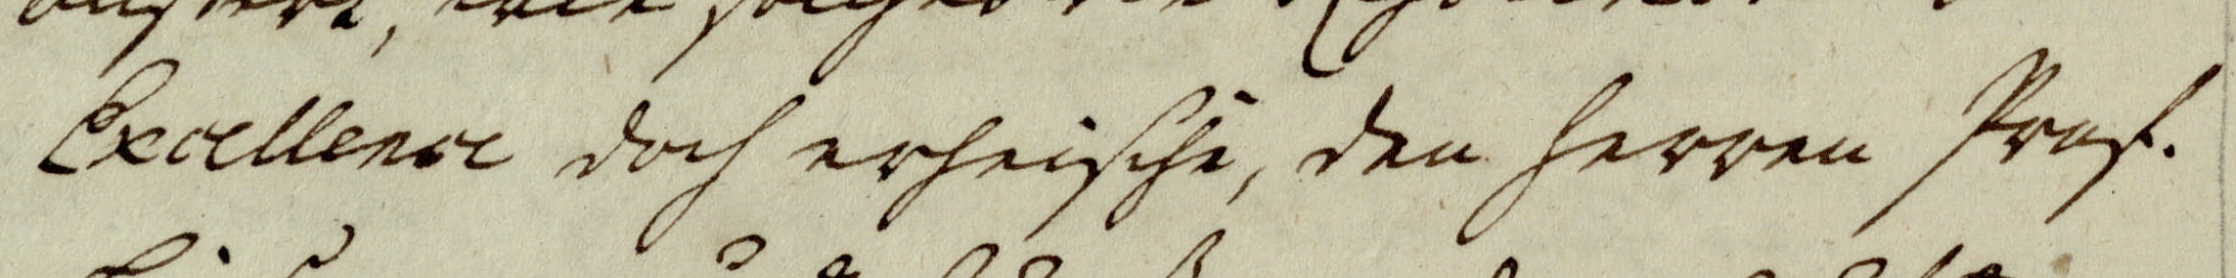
Excellence doch erheische, den Herren Prof.
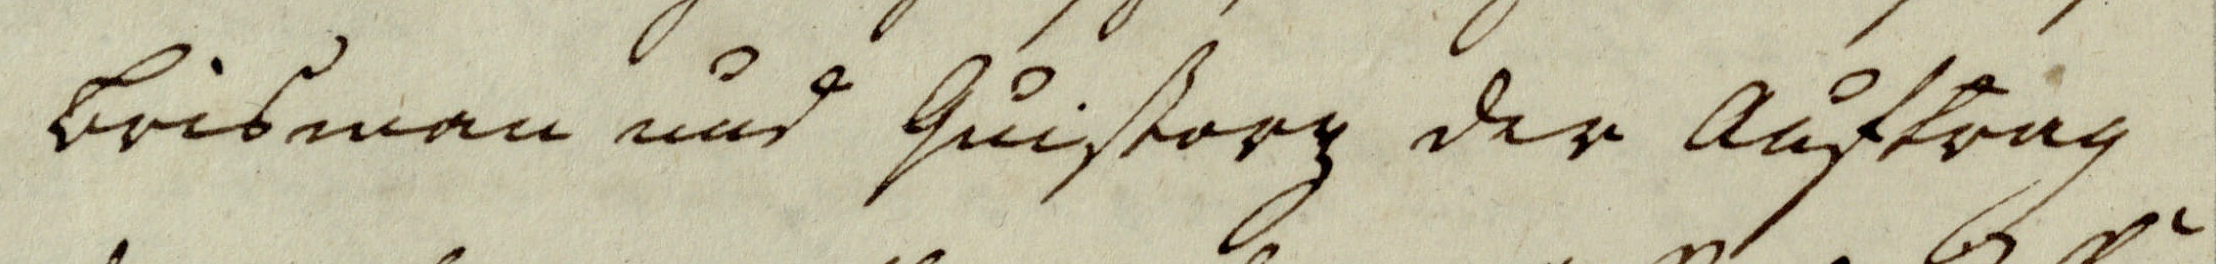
Brisman und Quistorp der Auftrag
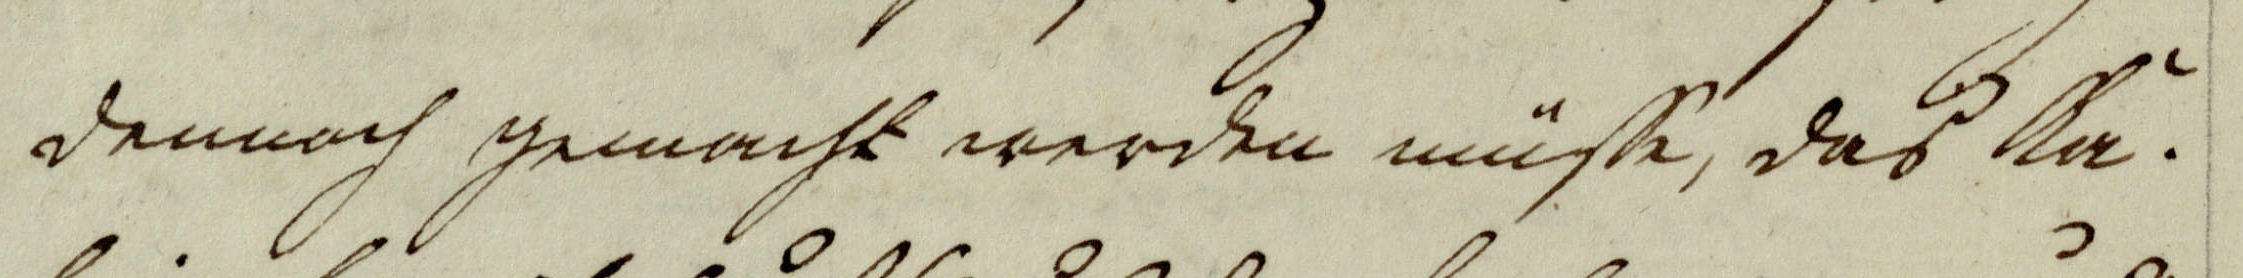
dennoch gemacht werden müsse, das Ka¬
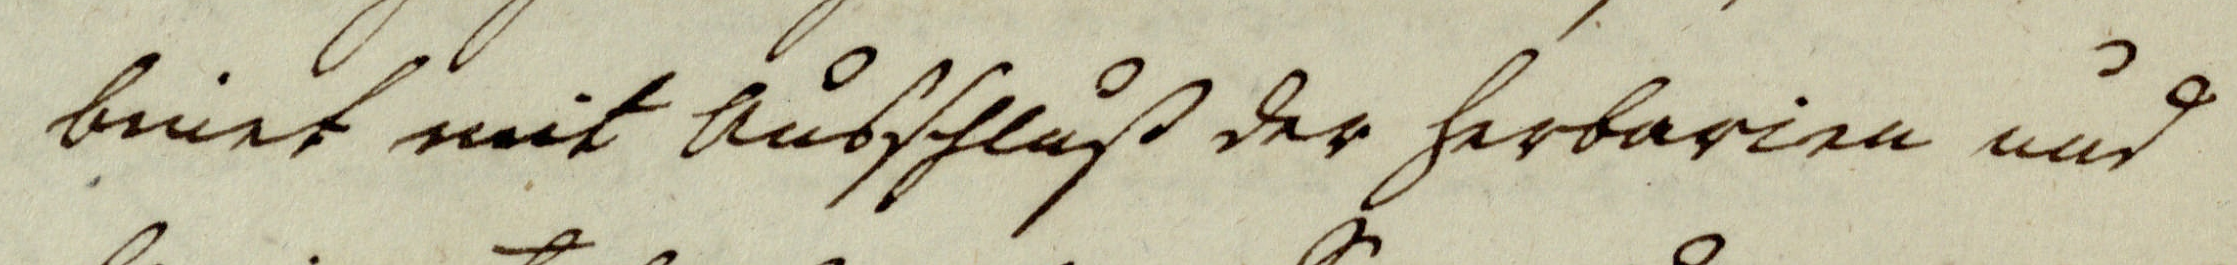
binet mit Ausschluß der Herbarien und
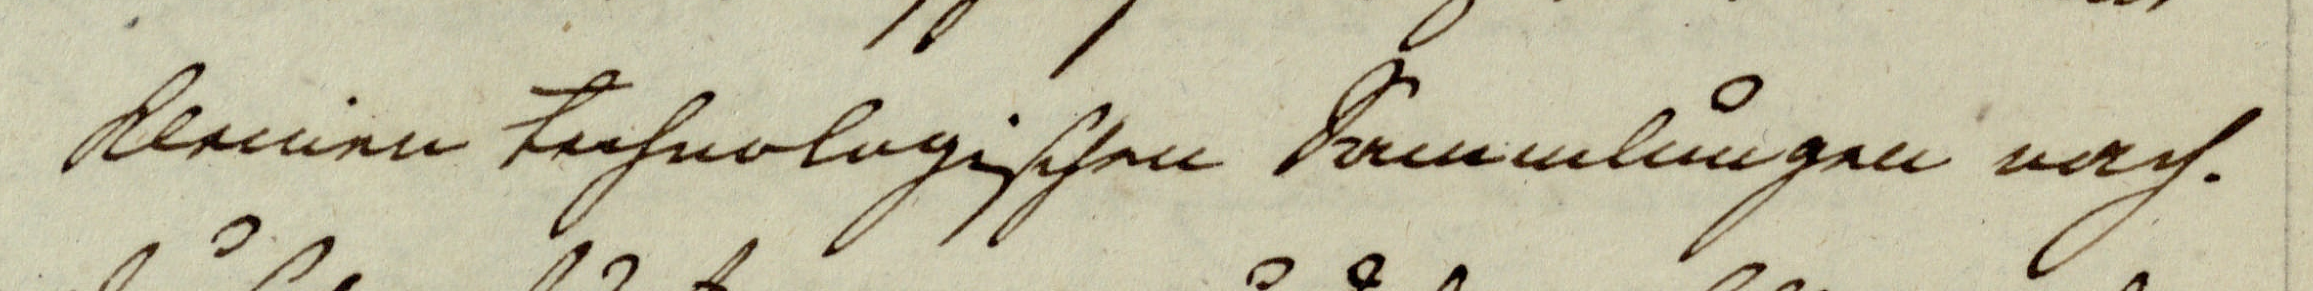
kleinen technologischen Sammlungen nach¬
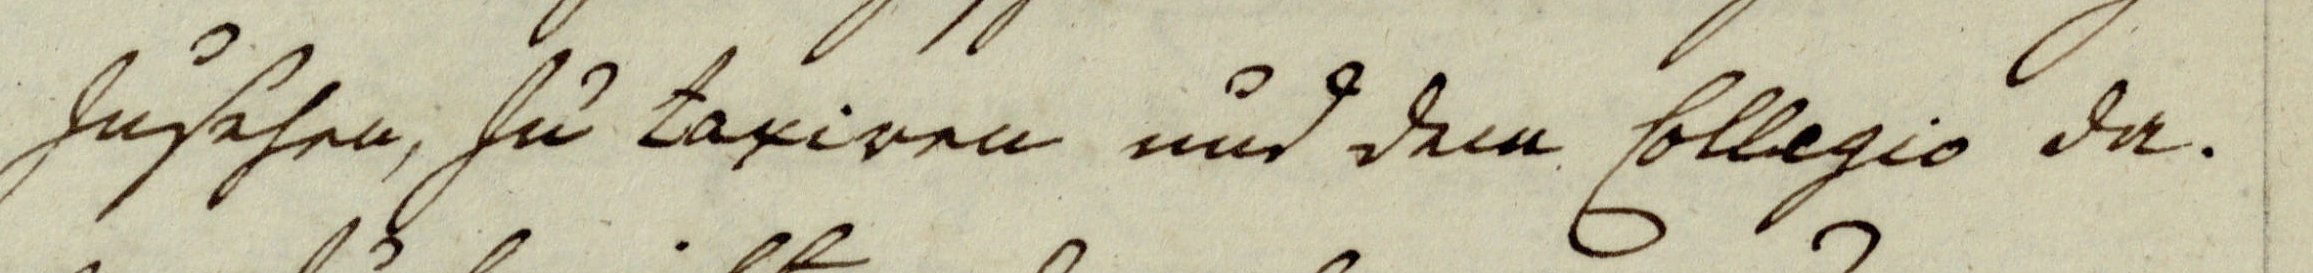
zusehen, zu taxiren und dem Collegio da¬
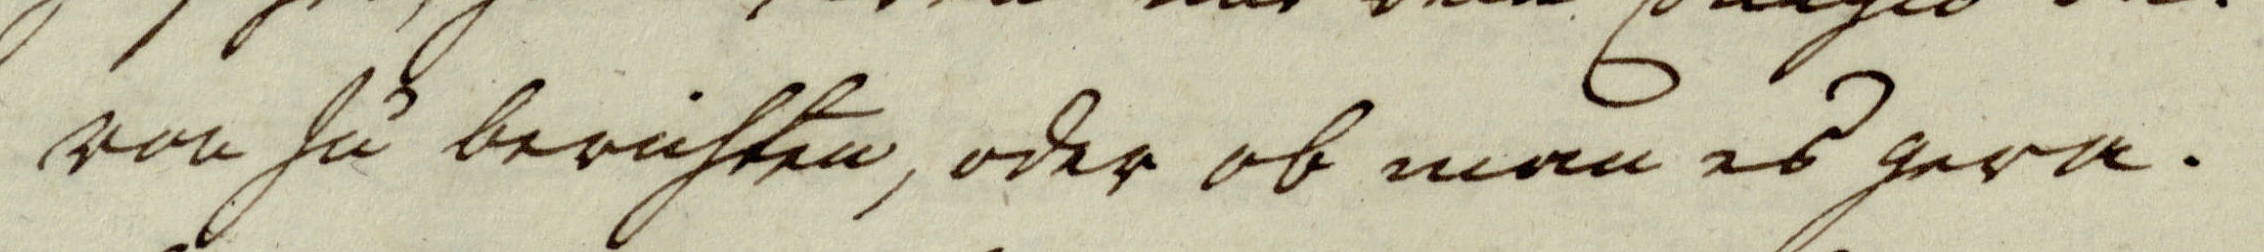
von zu berichten, oder ob man es gera¬
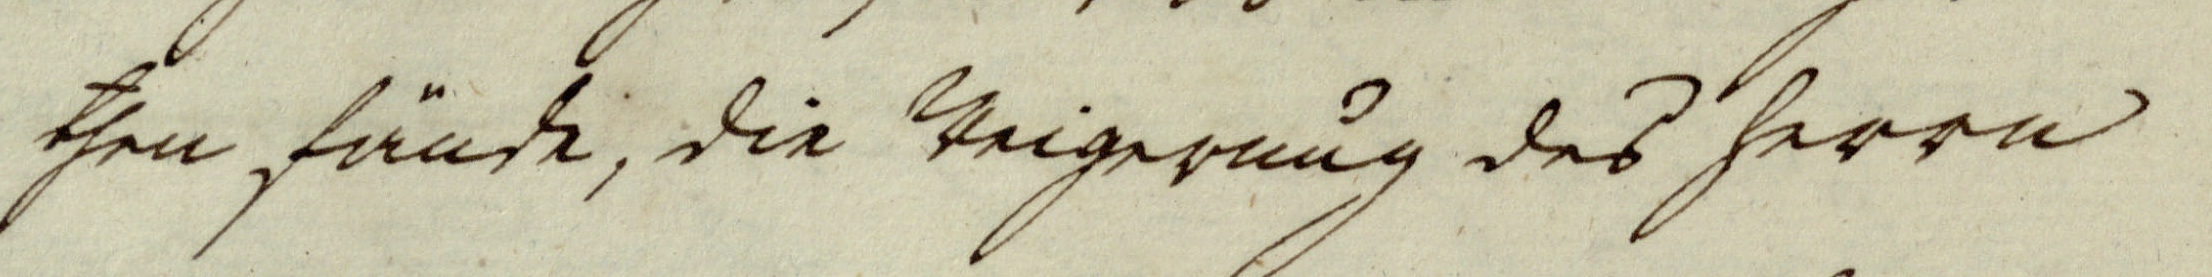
then fände, die Weigerung des Herrn
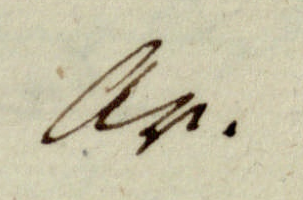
Ar¬
